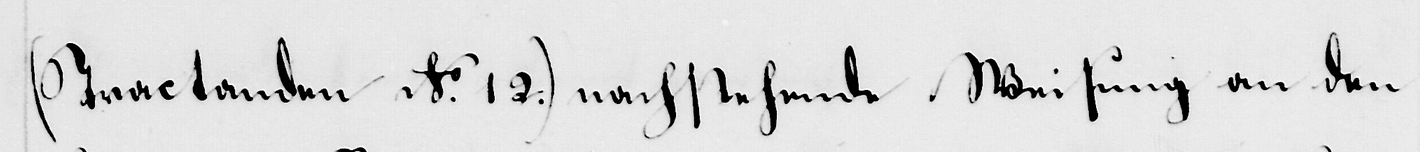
(Tractanden N°. 12.) nachstehende Weisung an den
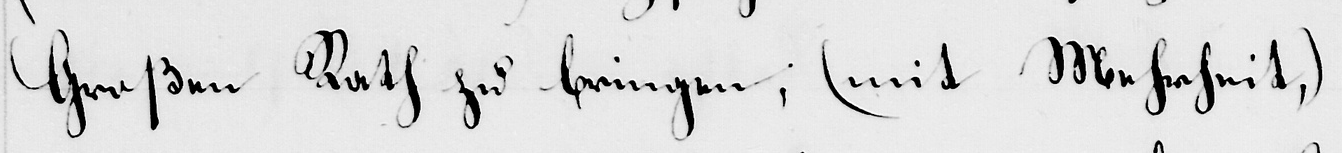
Großen Rath zu bringen; (mit Mehrheit,)
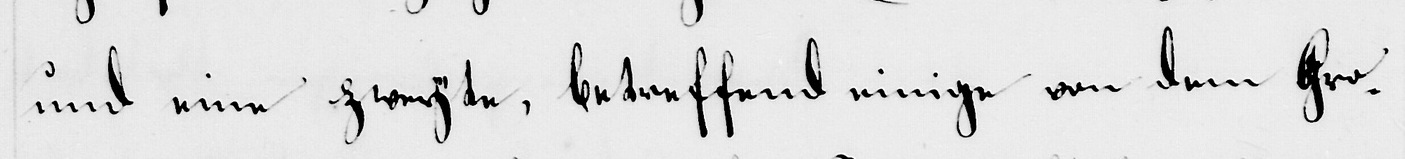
und eine zweyte, betreffend einige von dem Gro¬
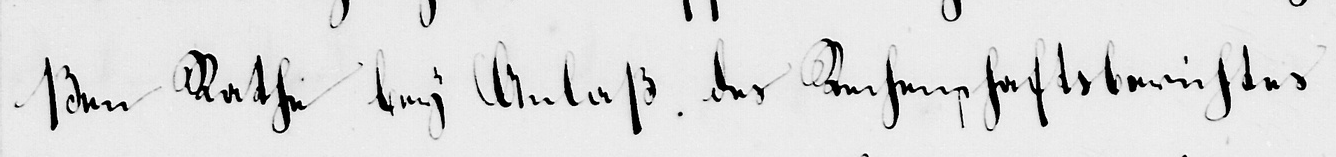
ßen Rathe bey Anlaß des Rechenschaftsberichtes
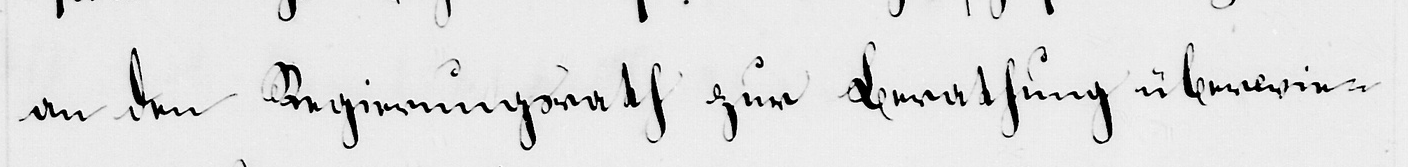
an den Regierungsrath zur Berathung überwie¬
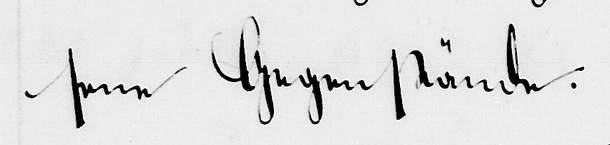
sene Gegenstände.
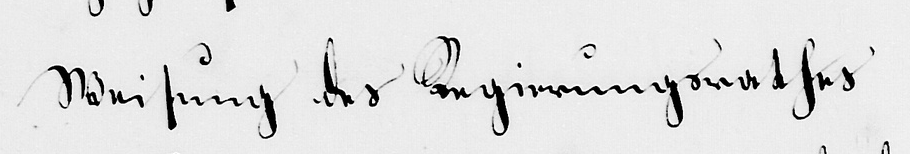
Weisung des Regierungsrathes
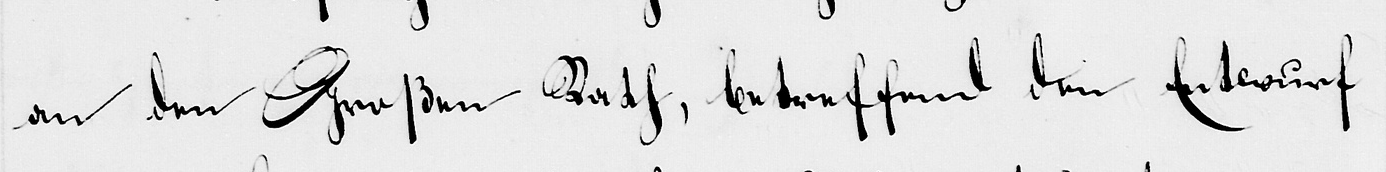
an den Großen Rath, betreffend den Entwurf
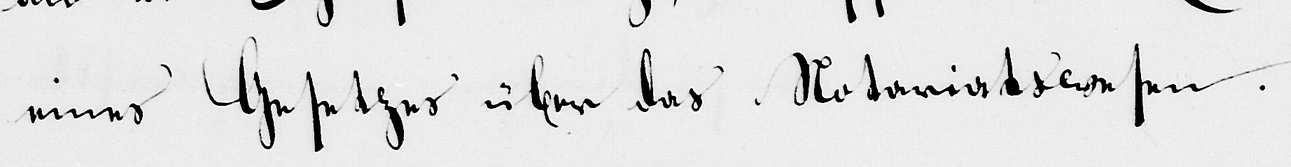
eines Gesetzes über das Notariatswesen.
